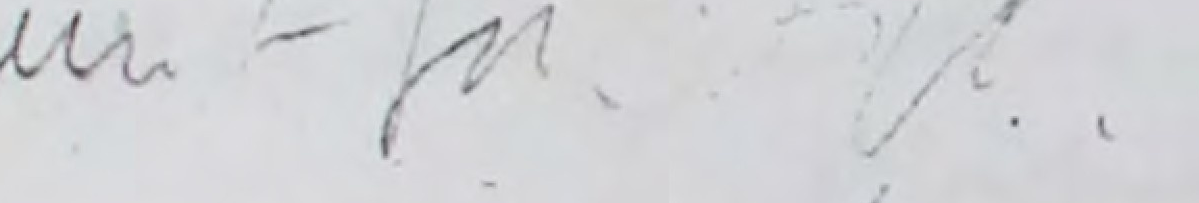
mit g???
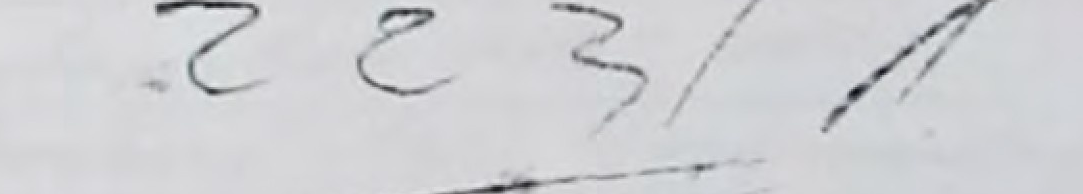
223/1
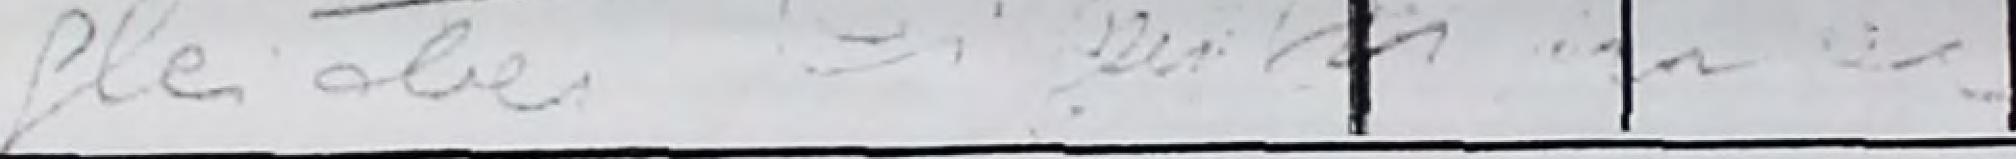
glei??? Ei???
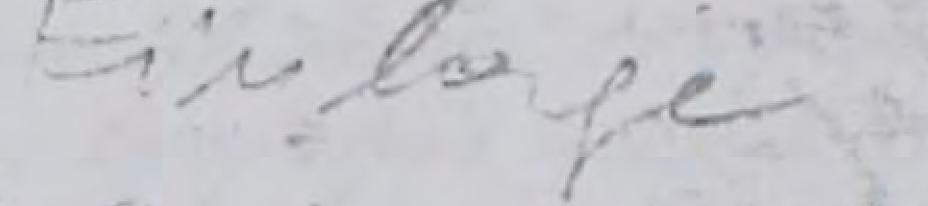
Einlage
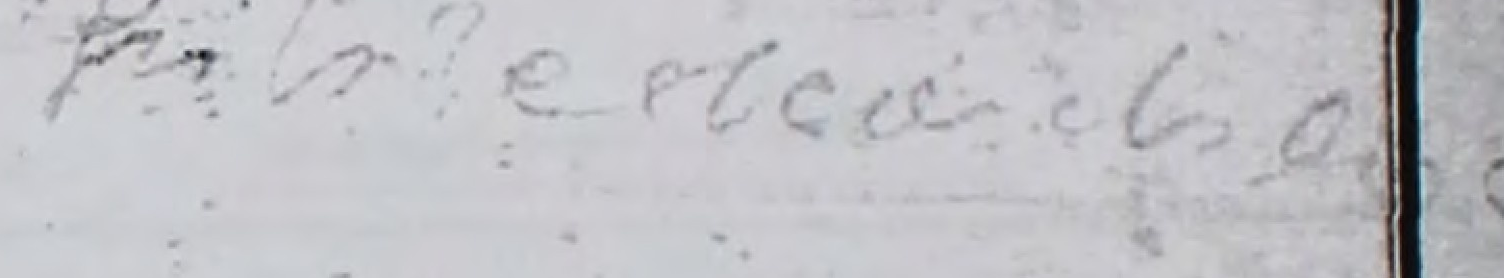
???
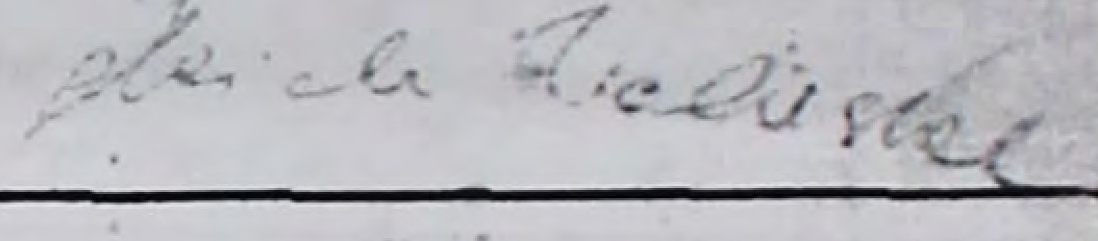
glei ???
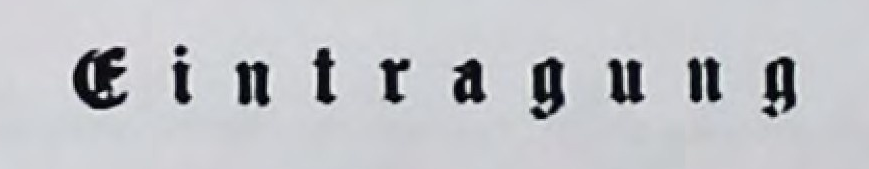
Eintragung
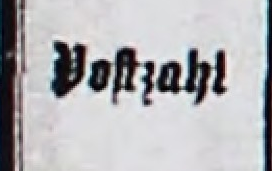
Postzahl
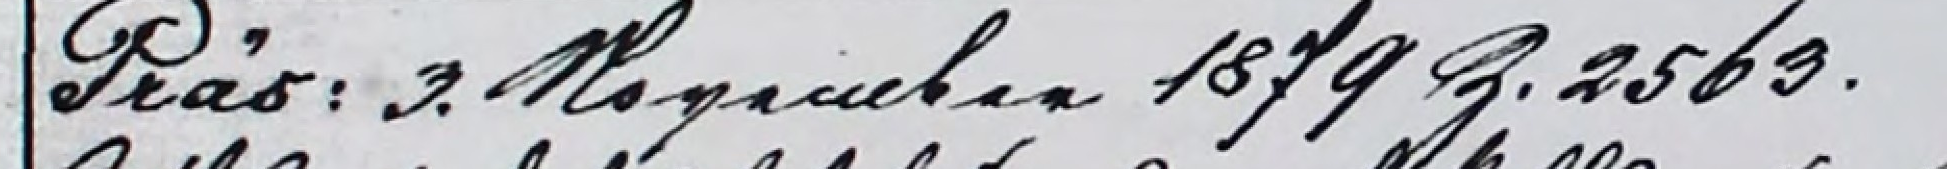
Präs: 3. November 1879 B. 2563.
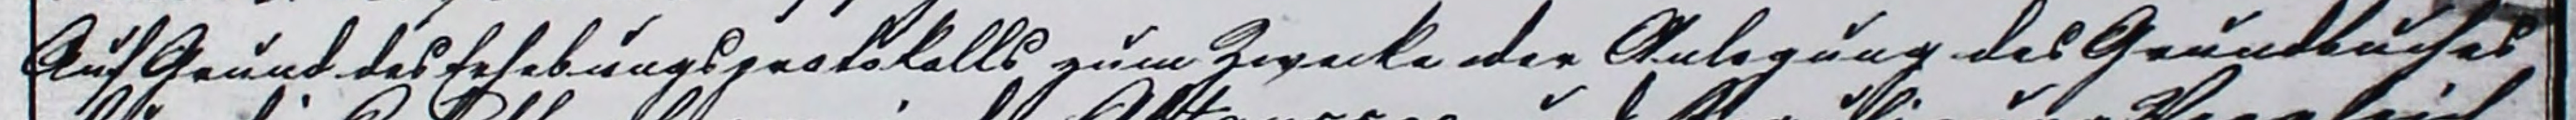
Auf Grund des Erhebungsprotskells zum Zwecke der Anlegung des Grundbuches
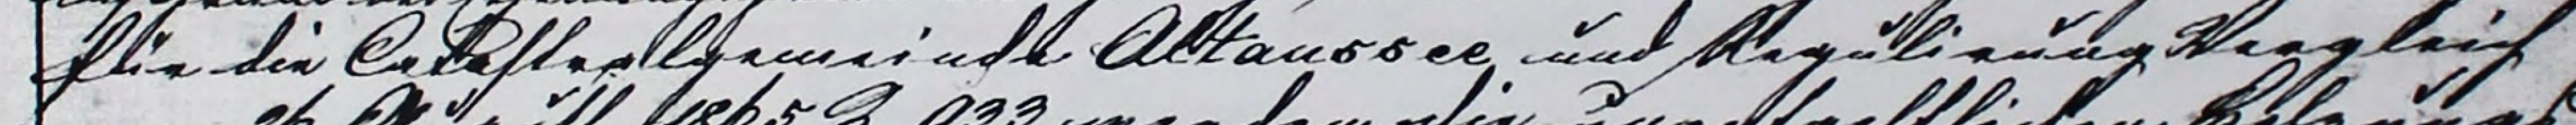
für die Catastralgemeinde Altaussee und Regulirung Vergleich
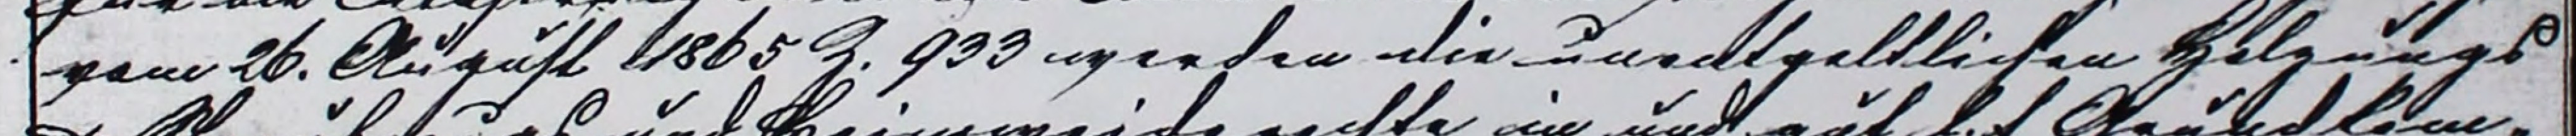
vom 26. August 1865 Z. 933 werden die unentgeltlichen Holzungs
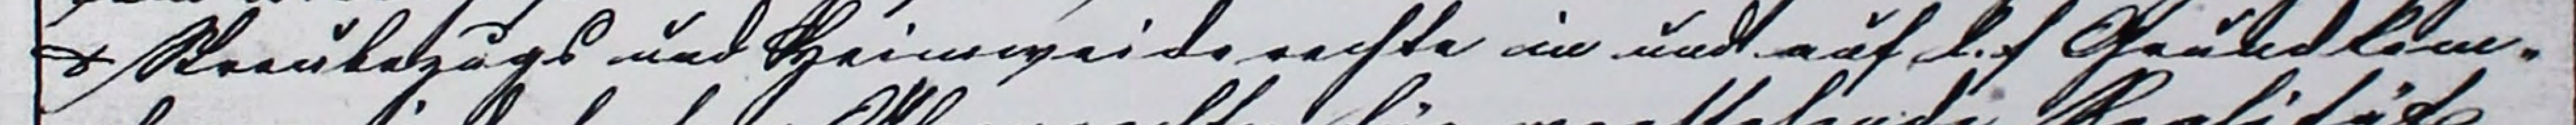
& Streubezugs und Heimweiderechte im und auf l.f Grundkom„
